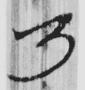乃
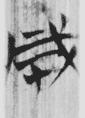成
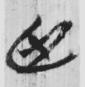臣
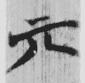亓
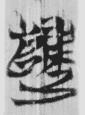歸
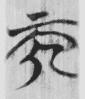而
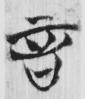言
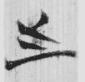之
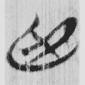臣
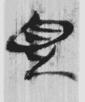見
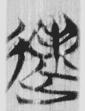遺
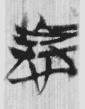者
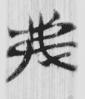弗
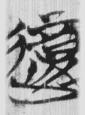復
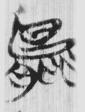{日能}
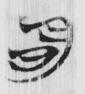明
